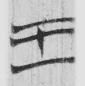王
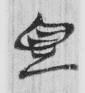見
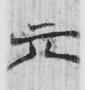亓
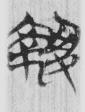執
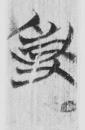事
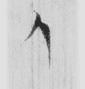人
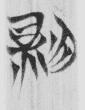則
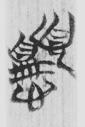{頁心頁}
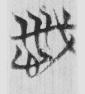慼
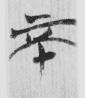不
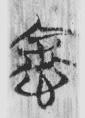{余心}
